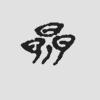參
